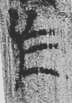於
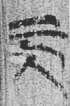天
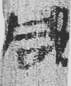咸
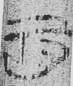百
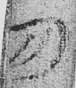勿（物）
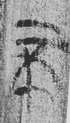不
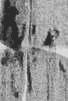死
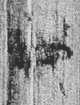女（如）
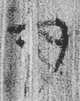月
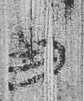出
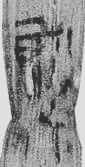惻（則）
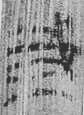或（又）
